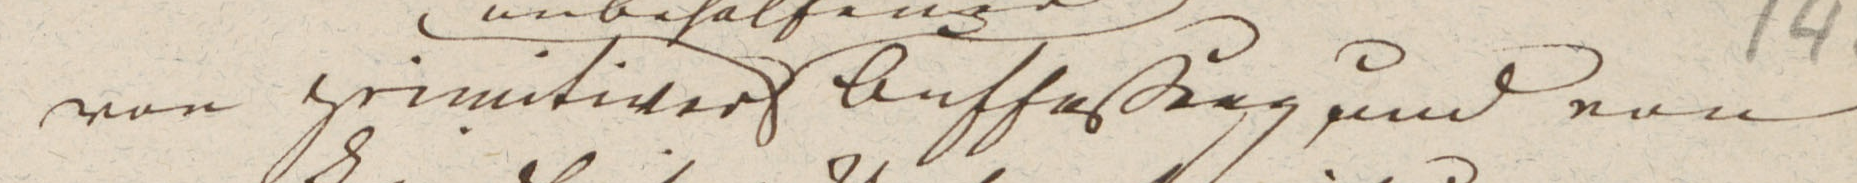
von primitiver unbeholfener Auffassung nd von
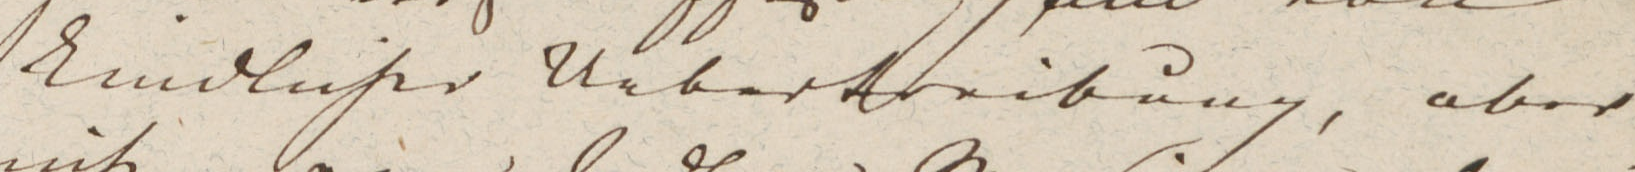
kindlicher Uebertreibung, aber
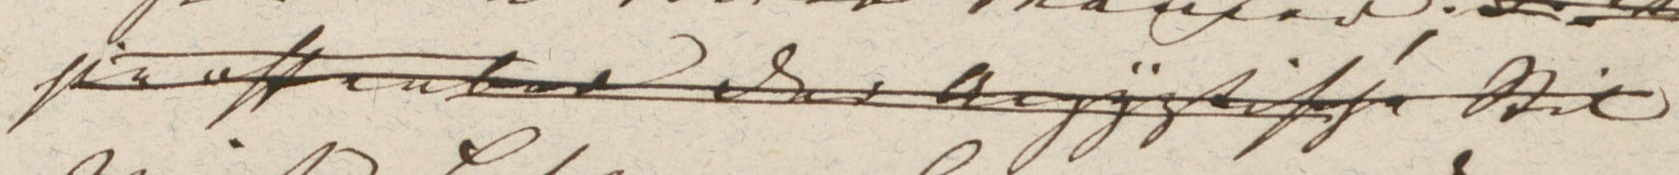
sie offenbar der Aegyptische Stil
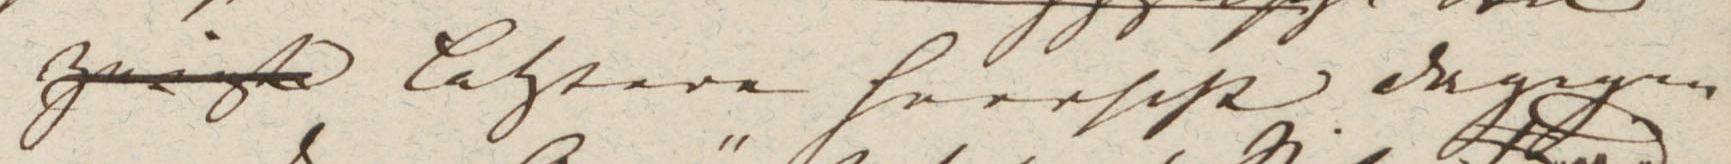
zeigt letztere herrscht dagegen
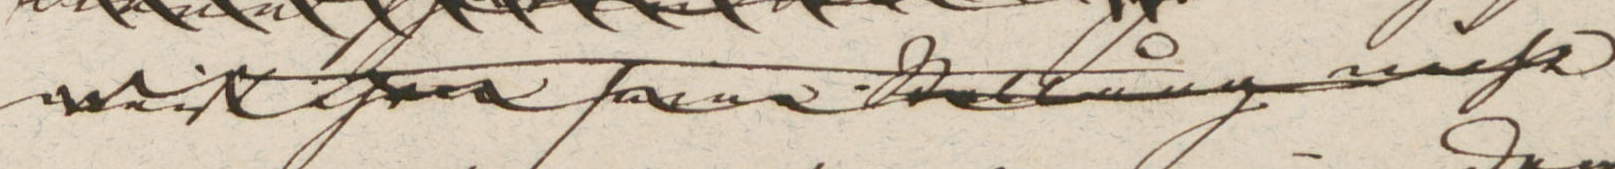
weist ihre seine Stellung nicht
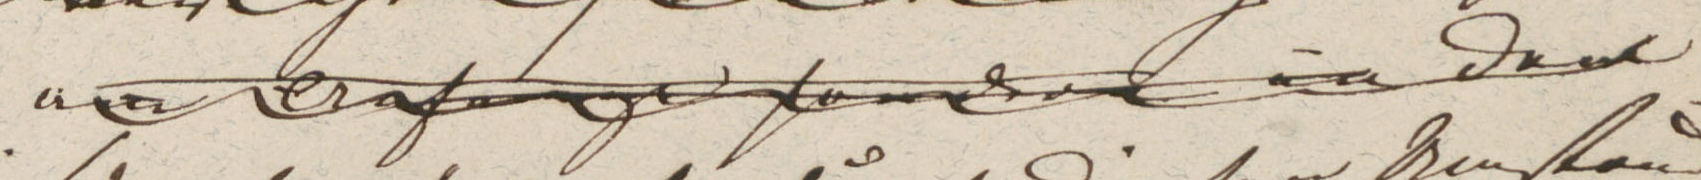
%am Anfange sondern in dem
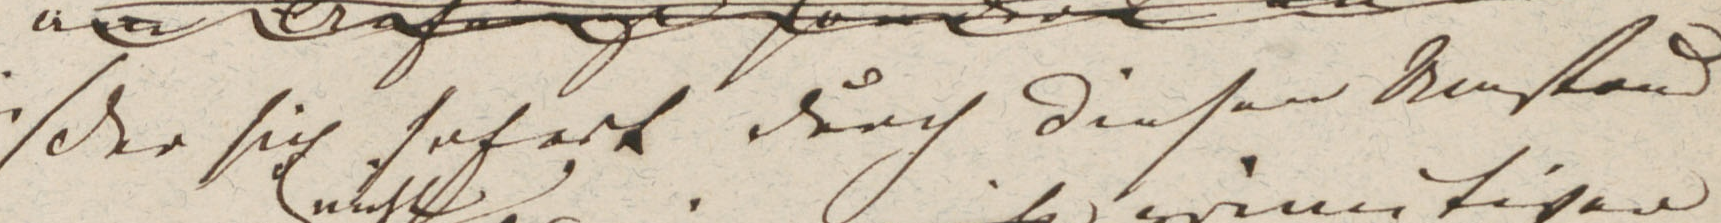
der sich sofort durch diesen Umstand
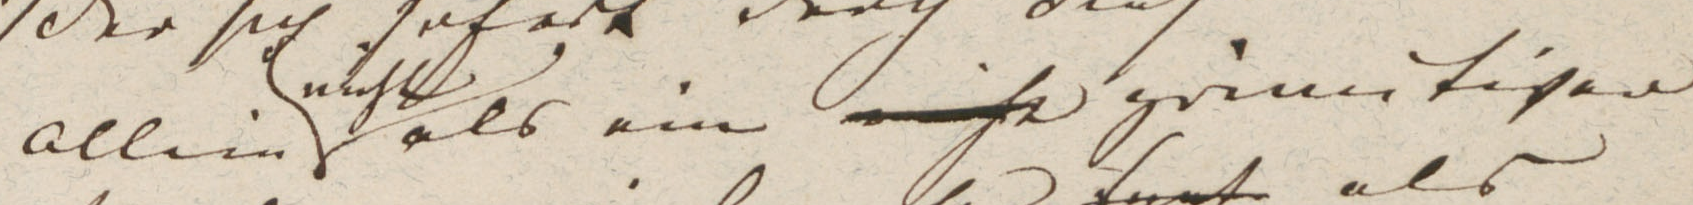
allein nicht als ein nicht primitiver
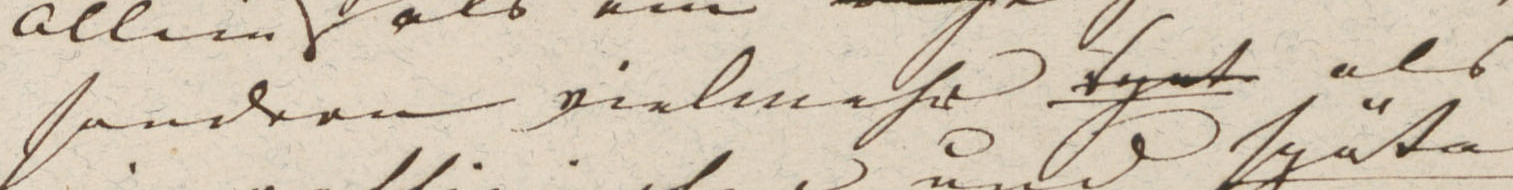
sondern vielmehr spat als
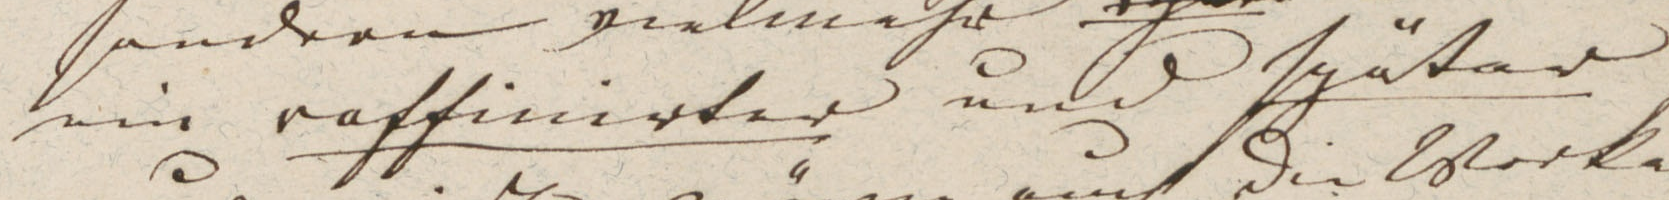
ein raffinirter und später
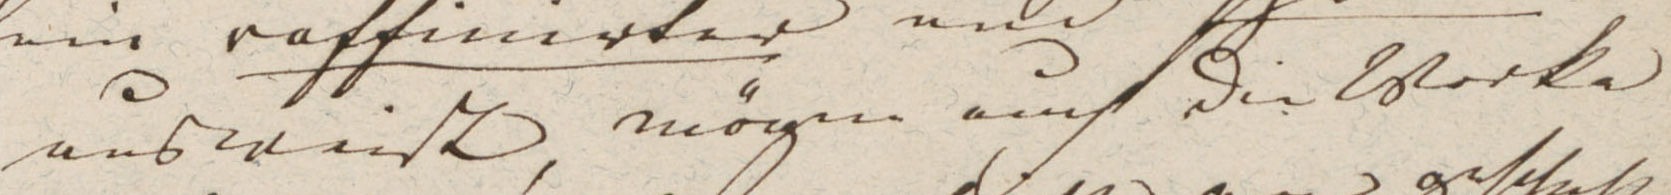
ausweist, mögen auch die Werke
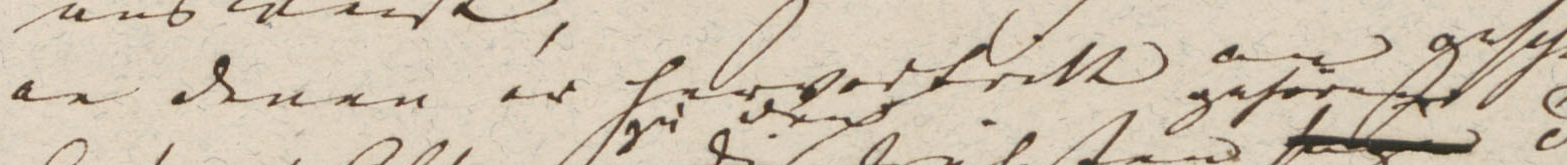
an denen er hervortritt an geschicht-
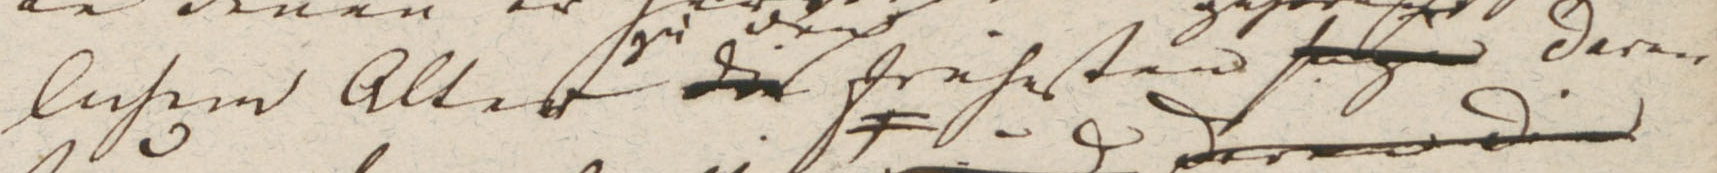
lichem Alter zu den die frühesten gehören seyn deren
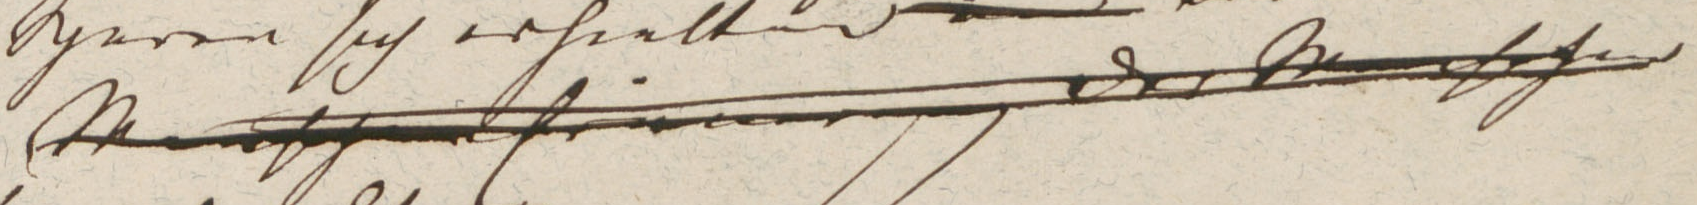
Menschen Erinnerung der Menschen
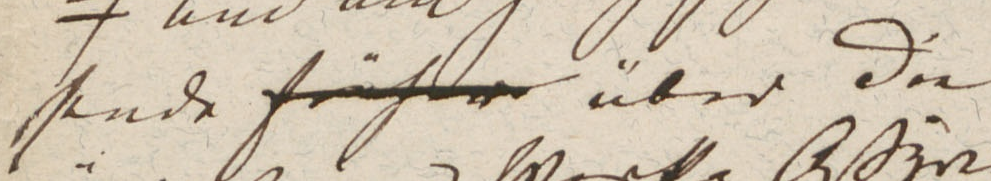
sende früher über die
